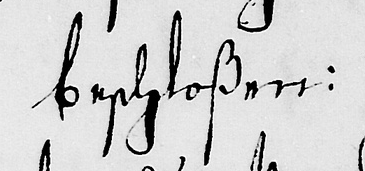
beschloßen:
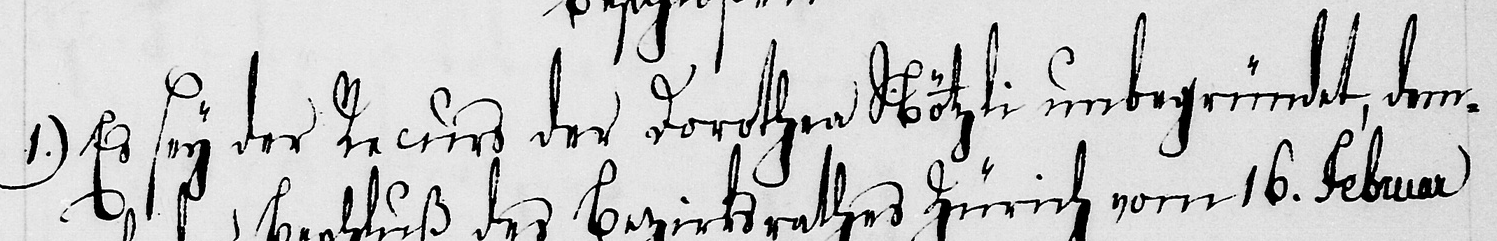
Es sey der Recurs der Dorothea Nötzli unbegründet, dem¬
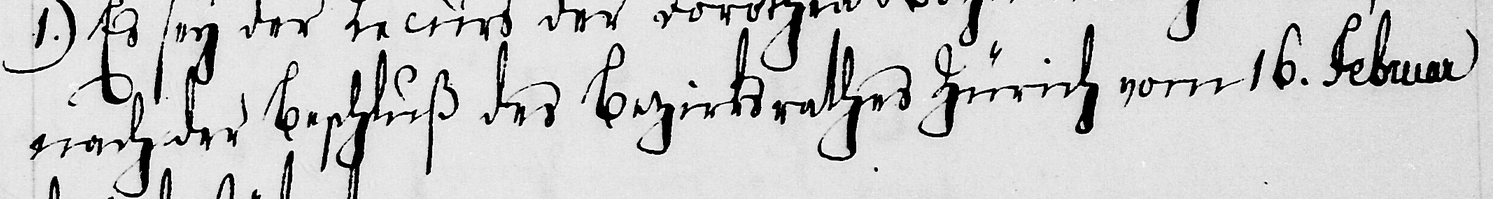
nach der Beschluß des Bezirksrathes Zürich vom 16. Februar
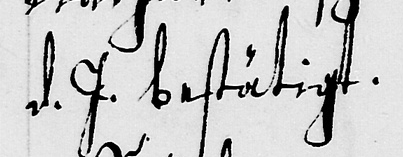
d. J. bestätigt.
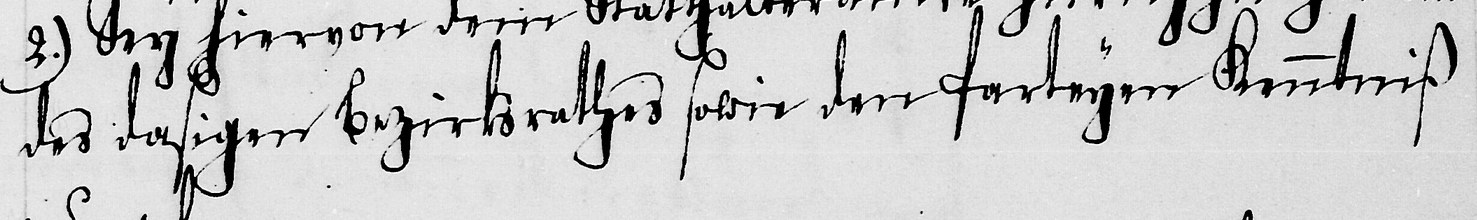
des dasigen Bezirksrathes sowie den Parteyen Kenntniß
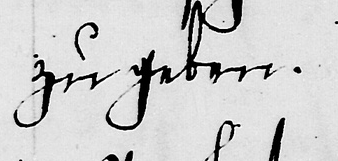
zu geben.
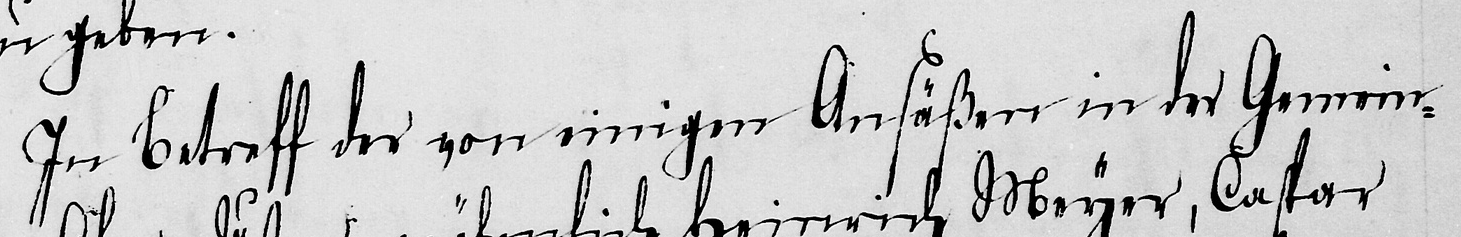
In Betreff der von einigen Ansäßen in der Gemein¬
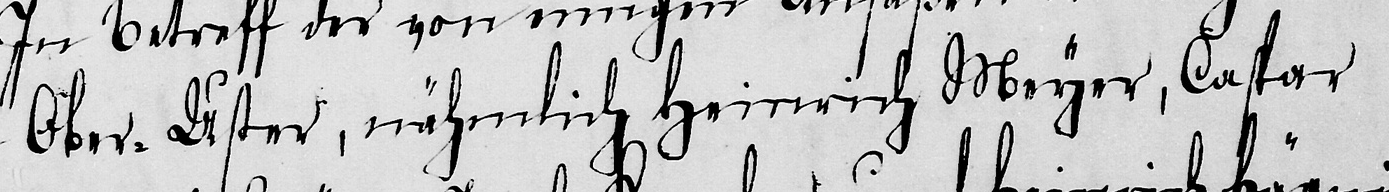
Ober-Uster, nähmlich Heinrich Meyer, Caspar
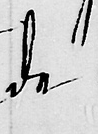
de
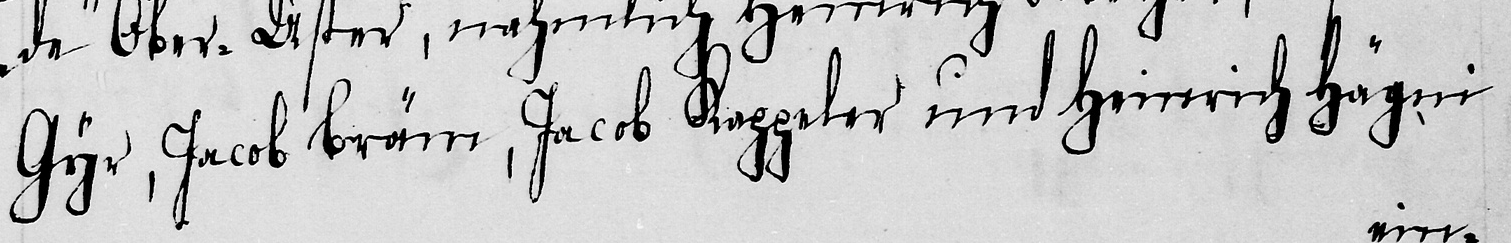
Gyr, Jacob Bräm, Jacob Kappeler und Heinrich Hägni
